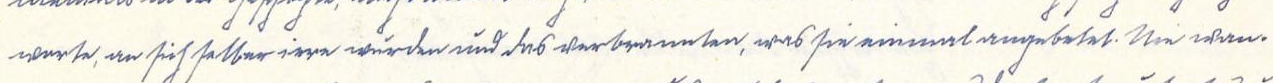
worte, an sich selber irre wurden und das verbrannten, was sie einmal angebetet. Nie wan-
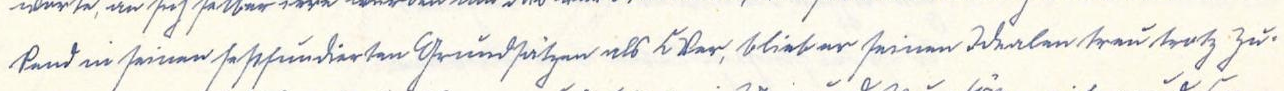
kend in seinen festfundierten Grundsätzen als CVer, blieb er seinen Idealen treu trotz Zu-
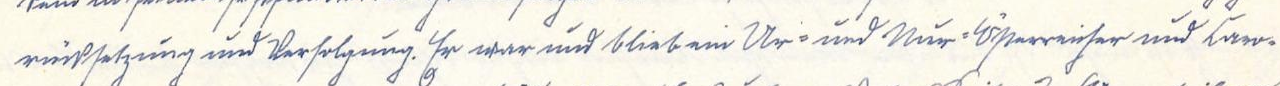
rücksetzung und Verfolgung. Er war und blieb ein Ur- und Nur-Österreicher und Caro-
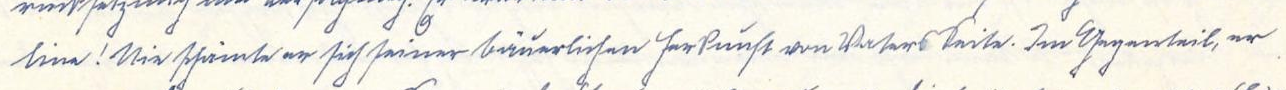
line! Nie schämte er sich seiner bäuerlichen Herkunft von Vaters Seite. Im Gegenteil, er
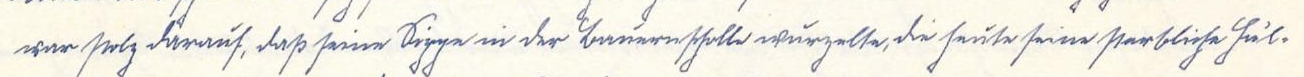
war stolz darauf, dass seine Sippe in der Bauernscholle wurzelte, die heute seine sterbliche Hül-
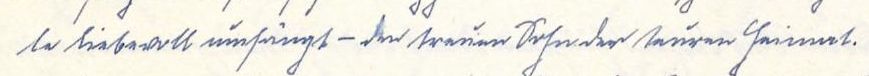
le liebevolle umfängt-den treuen Sohn der teuren Heimat. …
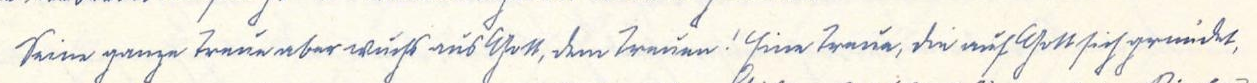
Seine ganze Treue aber wuchs aus Gott, dem Treuen! Eine Treue, die auf Gott sich gründet,
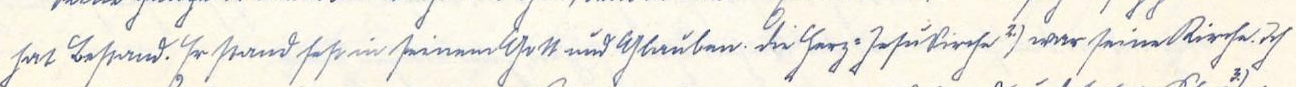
hat Bestand. Er stand fest in seinem Gott und Glauben. Die Herz- Jesukirche 2) war seine Kirche. Ich
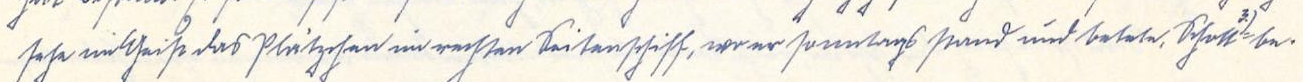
sehe im Geist das Plätzchen im rechten Seitenschiff, wo er sonntags stand und betete, Schott 3) be-
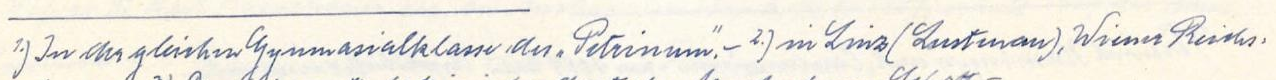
1) In dergleichen Gymnasialklasse des „Petrinum“.- 2) in Linz (Lustenau) Wiener Reichs-
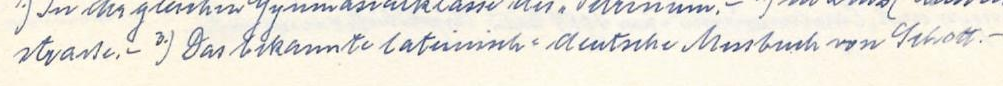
straße.- 3) Das bekannte lateinisch-deutsche Messbuch von Schott.
